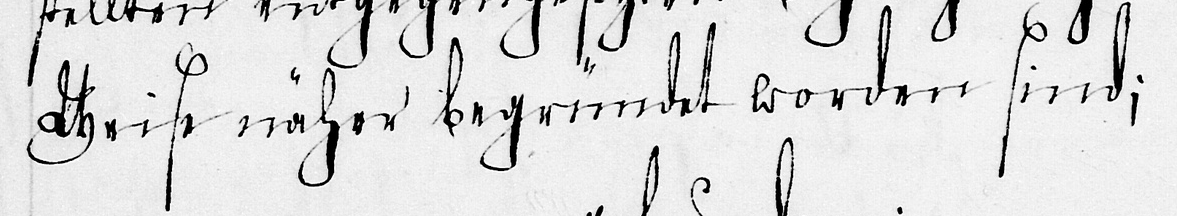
Weise näher begründet worden sind;
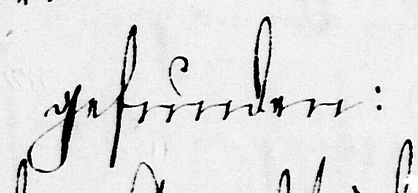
gefunden:
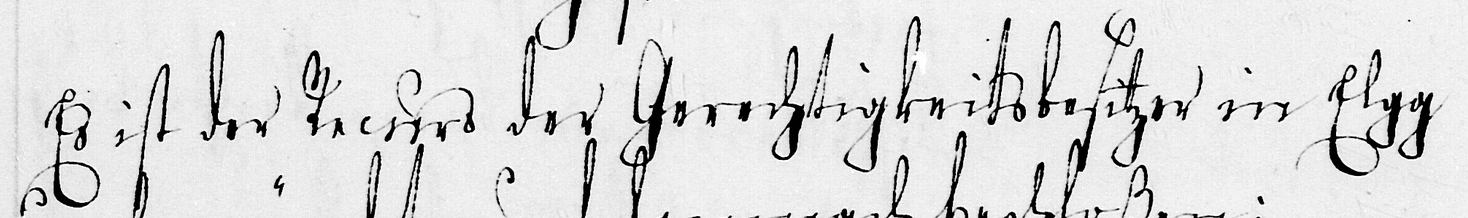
Es ist der Recurs der Gerechtigkeitsbesitzer in Elgg
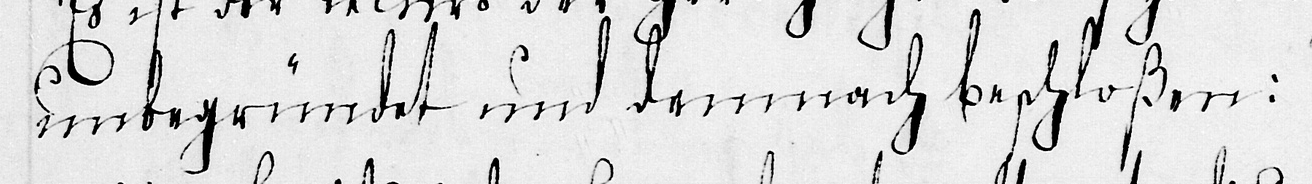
unbegründet und demnach beschloßen:
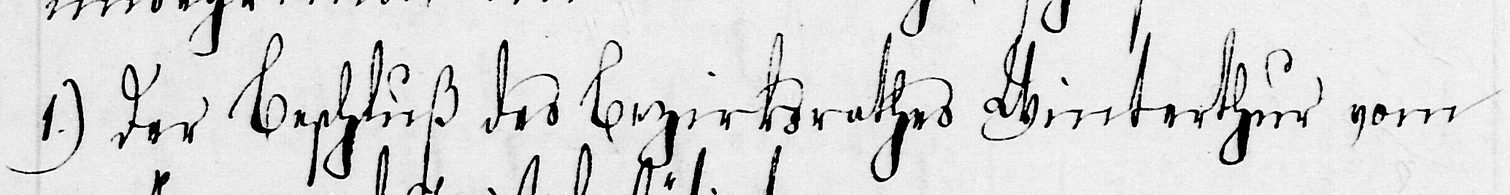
1.) Der Beschluß des Bezirksrathes Winterthur vom
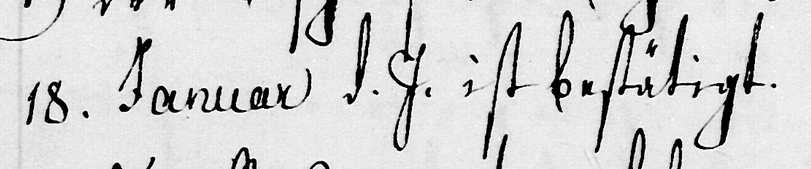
18. Januar d. J. ist bestätigt.
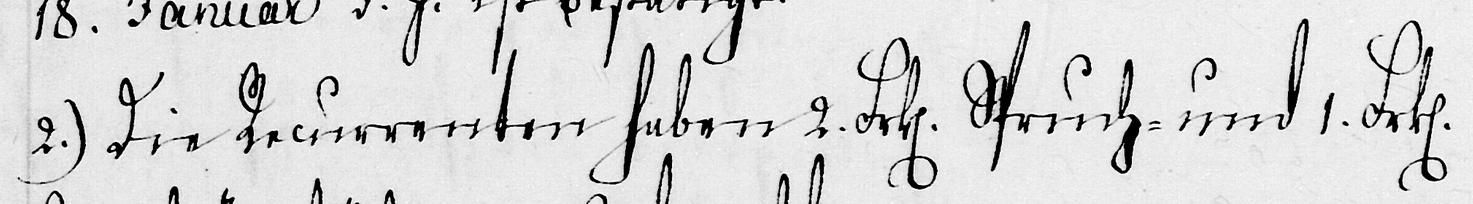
2.) Die Recurrenten haben 2. Frk[en]. Spruch-
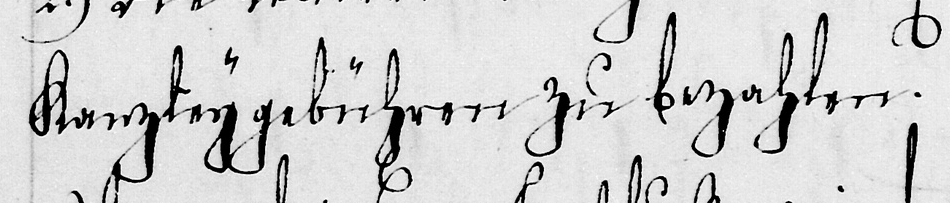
Kanzleygebühren zu bezahlen.
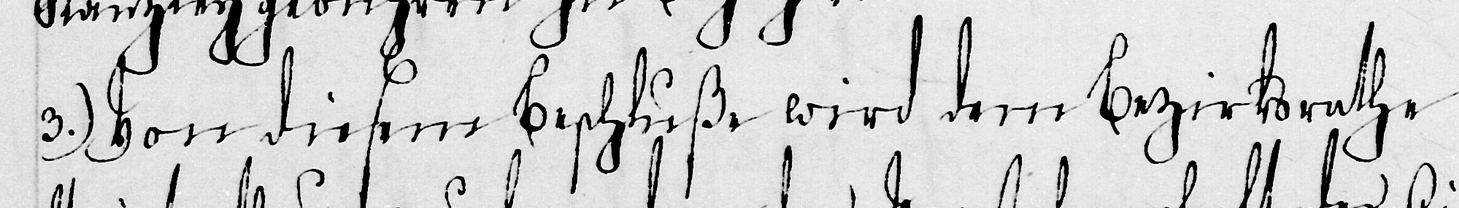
3.) Von diesem Beschluße wird dem Bezirksrathe
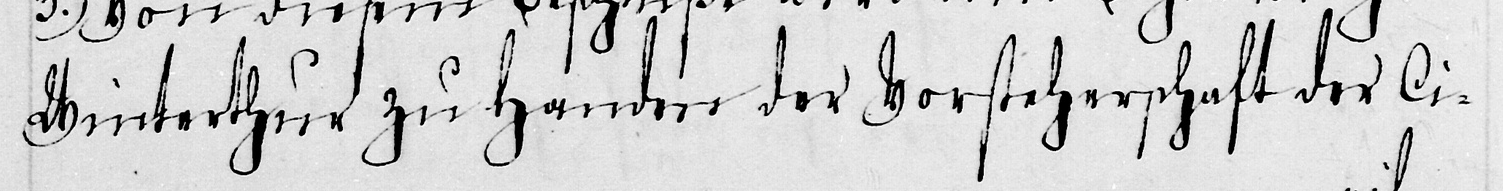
Winterthur zu Handen der Vorsteherschaft der Ci-
